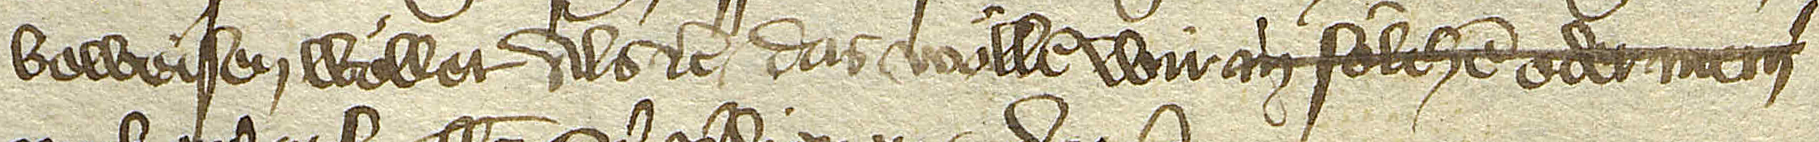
beweiſen wöllet Als ec* / das wölle* wir in* ſöliche* oder mern
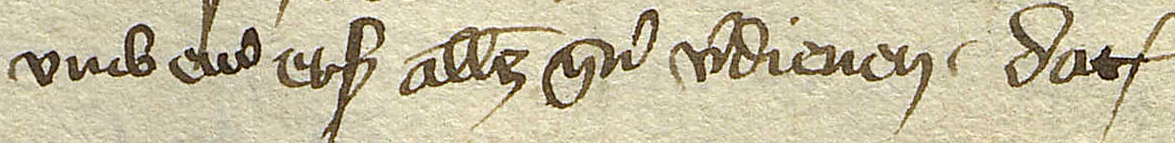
vmb ew* erſ* allcʒ* gn* v*dienen / dat*
